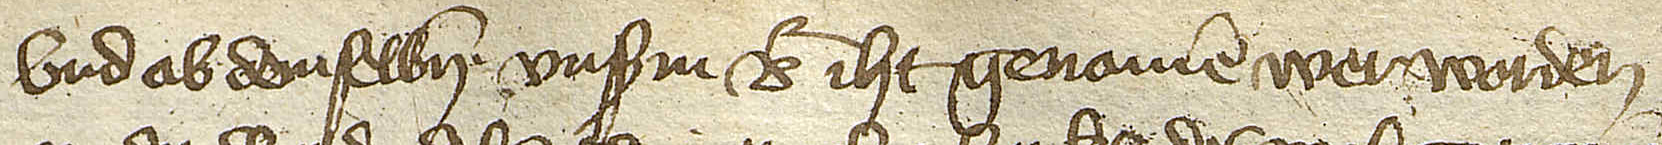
vnd ob demſelbn* ~ vnſ*m B* iht genome* wer worden
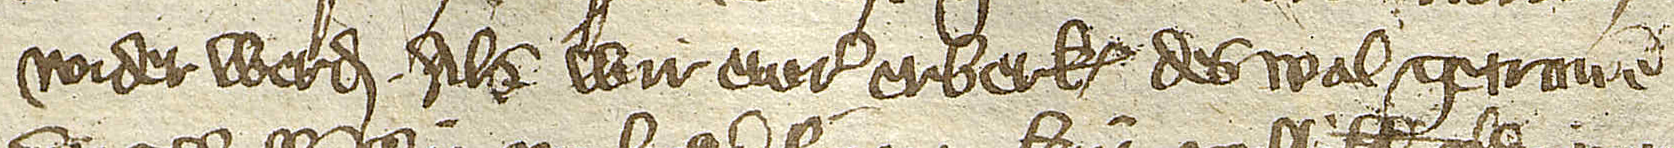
wider werd* / Als wir ewr* erberk* des wol getrawe*
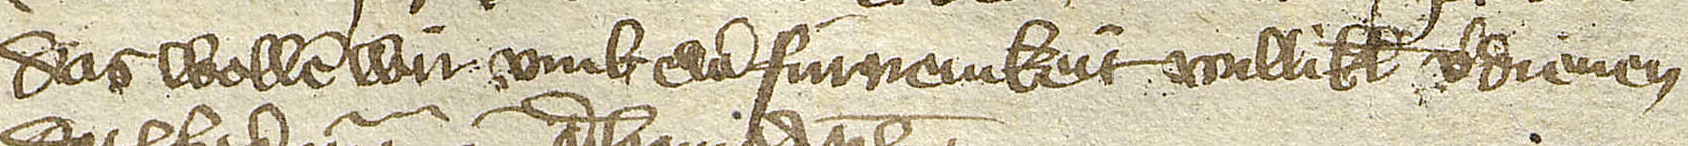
Das wolle* wir vmb ew* fürnemkeit willikl* v*dienen
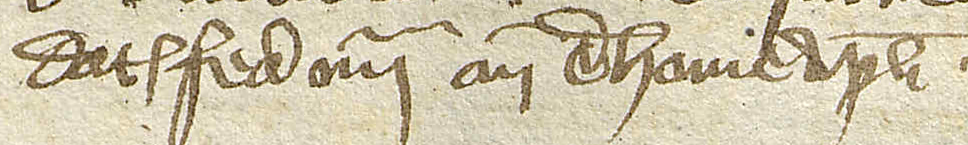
Dat* fea* iiii* an* Thome Apli*.
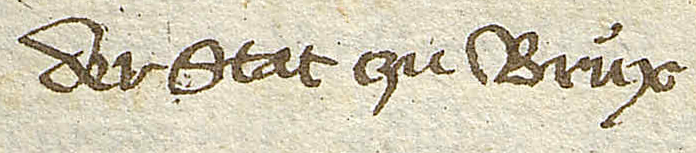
Der Stat cʒu Brüx
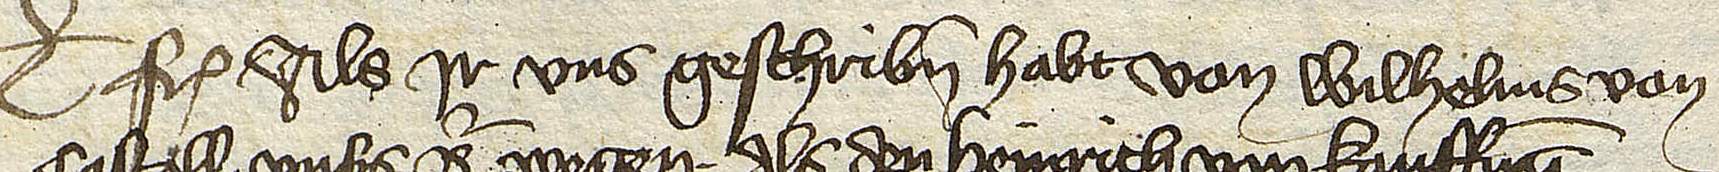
L* fr* / Als Ir vns geſchribn* habt von wilhelms von
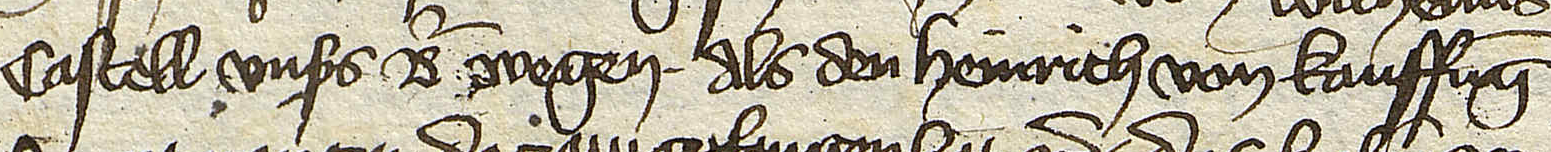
Caſtell vnſ*s B* wegen . Als den heinrich von kauffu*g
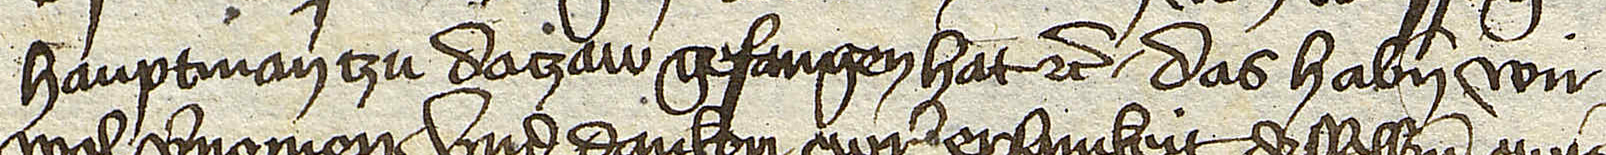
hauptman cʒu dacʒaw gefangen hat ec* / Das habn* wir
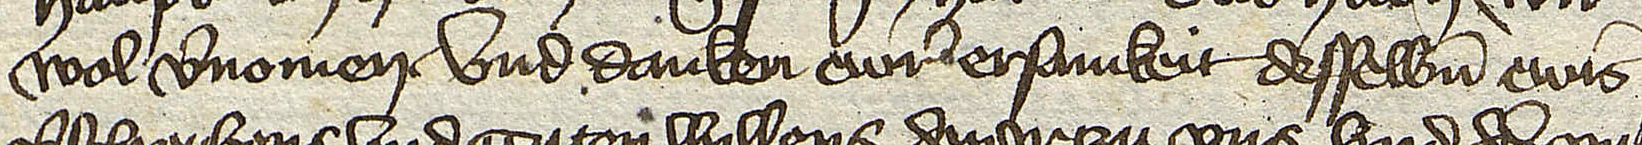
wol v*nomen / Vnd danken ewr* erſamkeit deſſelbn* ewrs*
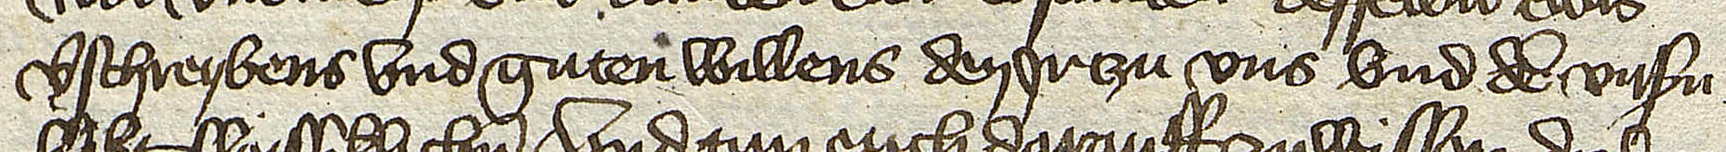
v*ſchreybens vnd guten willens den Ir cʒu vns vnd de* vnſ*n
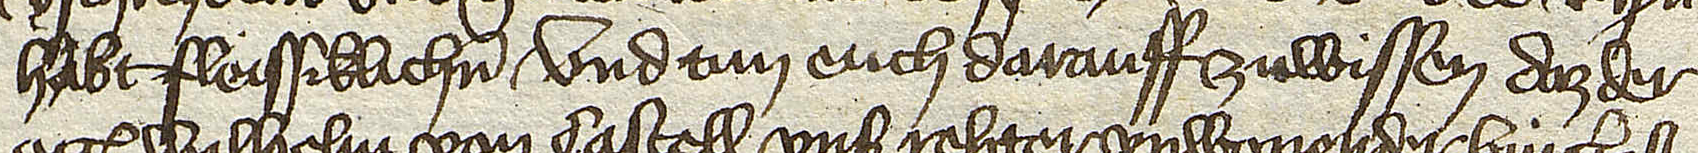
habt fleiſſeiklichn* / Vnd tun euch darauff cʒuwiſſen daʒ der
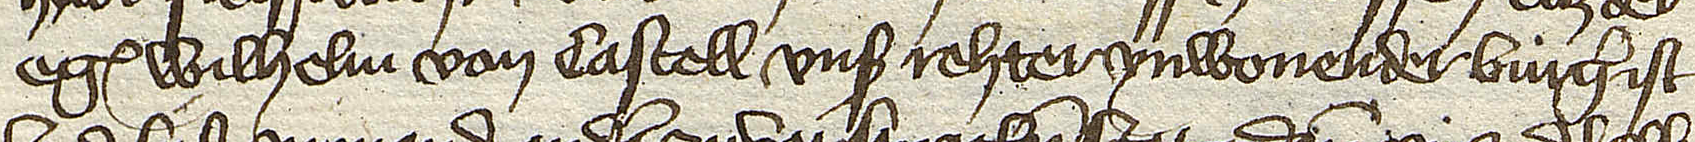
eg* wilhelm von Caſtell vnſ* rehter ynwonender bürg* iſt
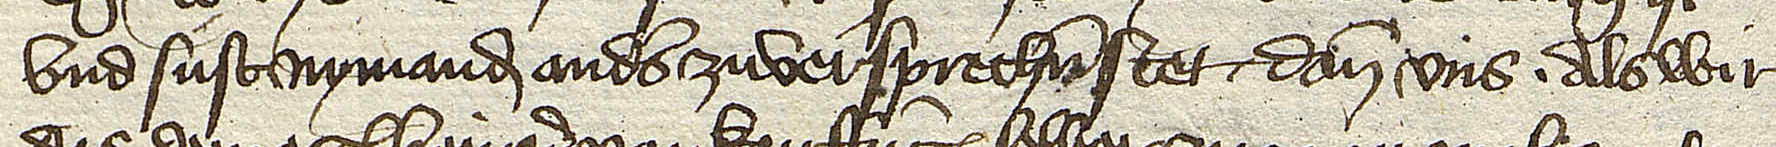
vnd ſüſt nymand* and*s cʒuverſprechn* ſtet / dan* vns . Als wir
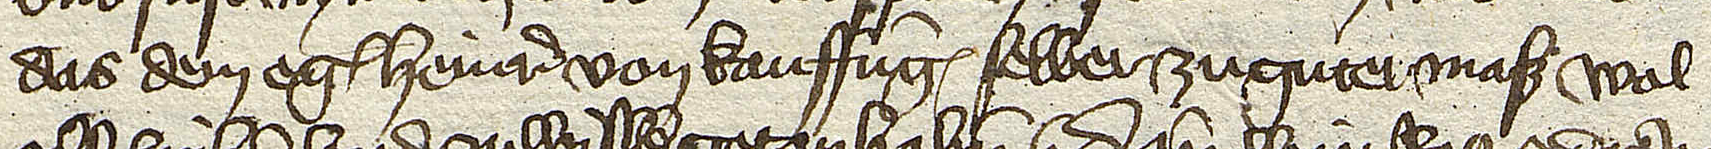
das dem eg* heinr* von kauffu*g ſelber cʒu guter maſʒ wol
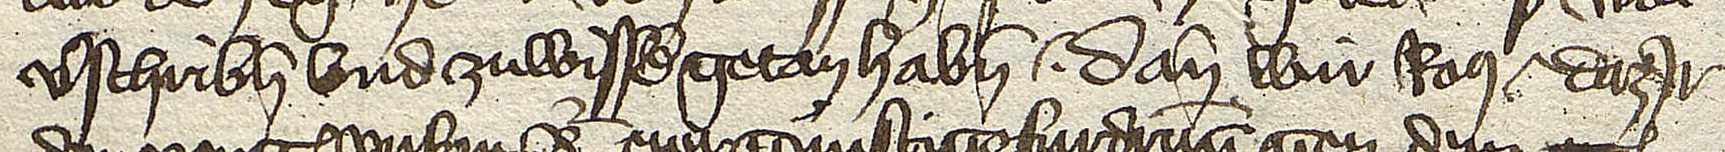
v*ſchribn* vnd ʒuwiſſe* getan habn* / . Dan* wir Ro* / daʒ Ir
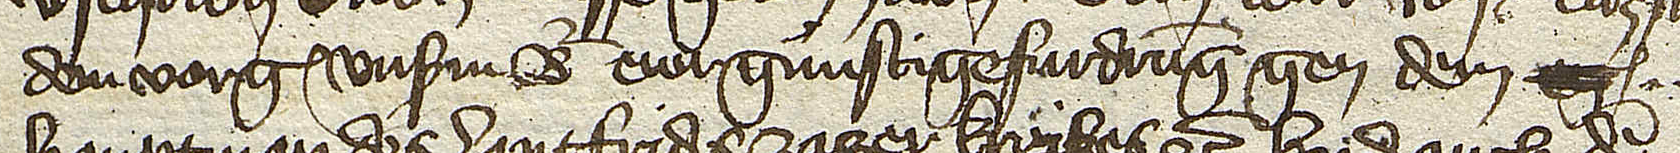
dem vorg* vnſ*m B* ewr günſtige furdru*g gen dem eg* ~
